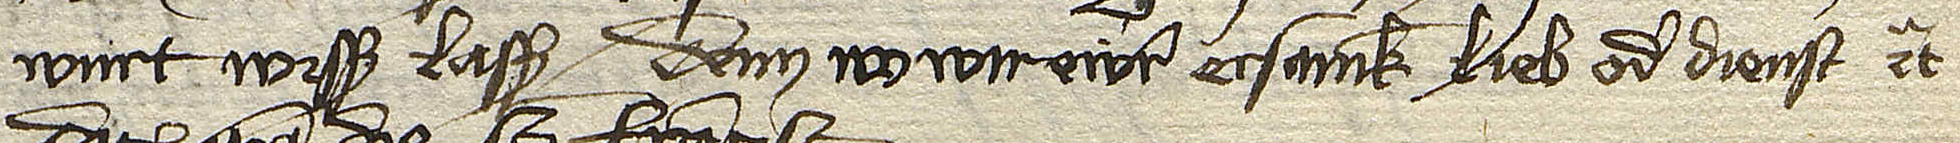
wurt wiſſ* laſſ* / Denn wo wir eẅr* erſamk* lieb od* dienſt ec*
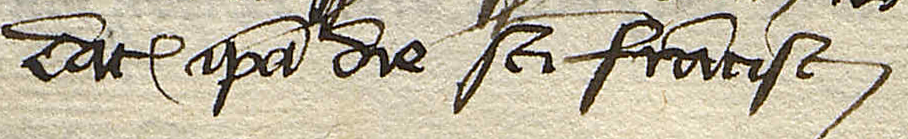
Dat* ipa* die ſ*ci fra*ciſci
